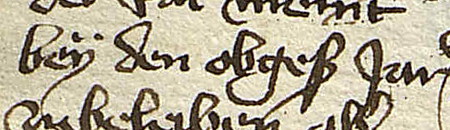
bey den obgeſ* Iar*
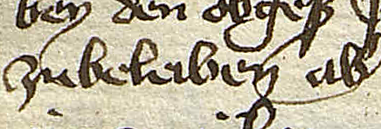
ʒu beleiben ab*
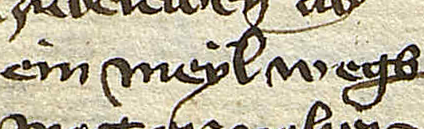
ein meyl wegs
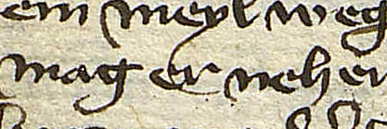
mag er neher
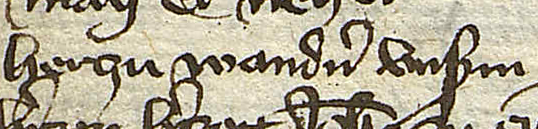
herʒu wand*n vnſ*m
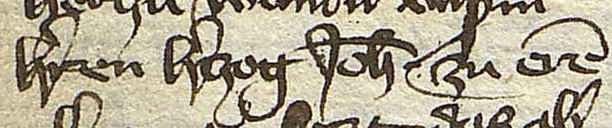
h*ren h*cʒog Ioh* ʒu ere*
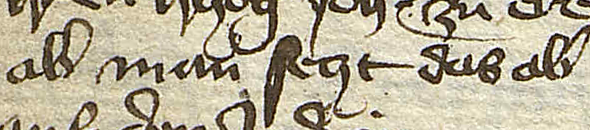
als man ſagt das ab*
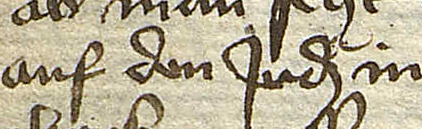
auf den Iud* in
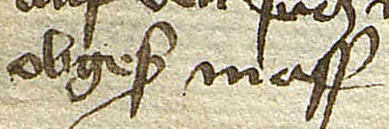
obgeſ* maſſ
